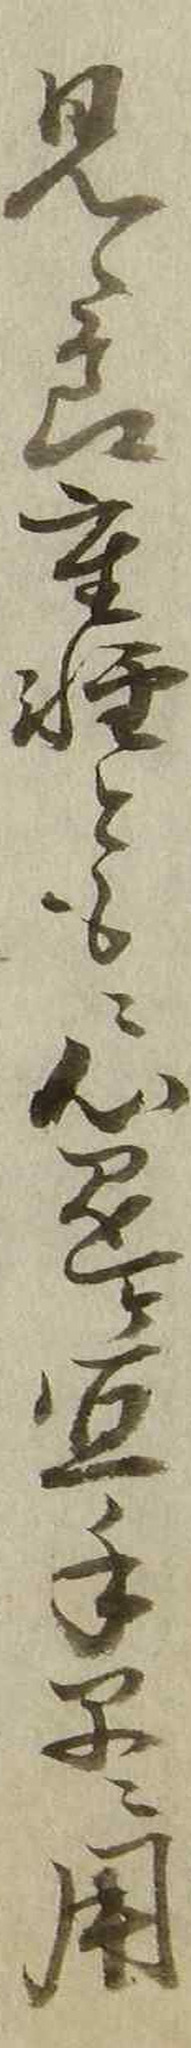見候節重軽ともニ心懸ヶ宜手早ニ用
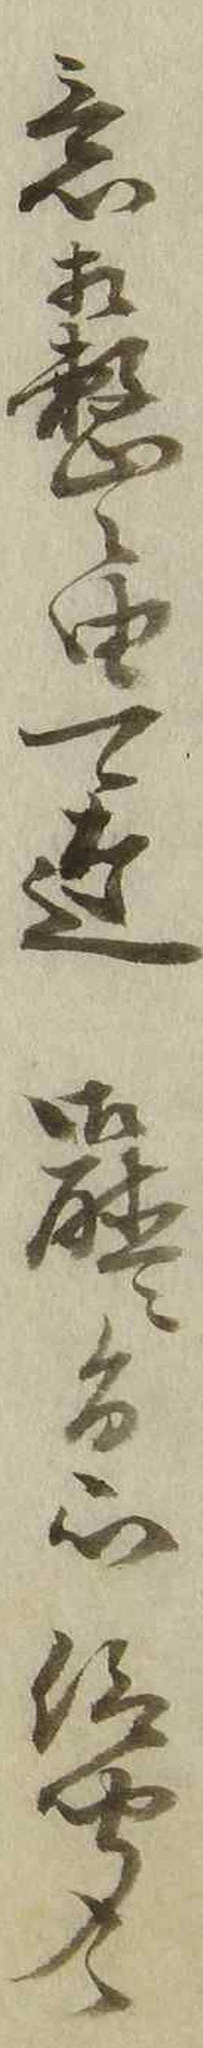意相整候由可達御聴ニ旨被仰聞候
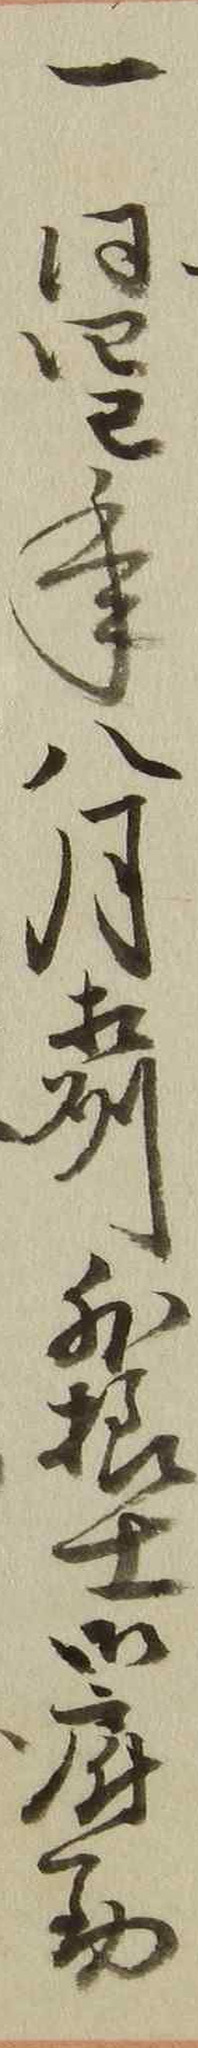一同四巳年八月相州外様士御雇勤
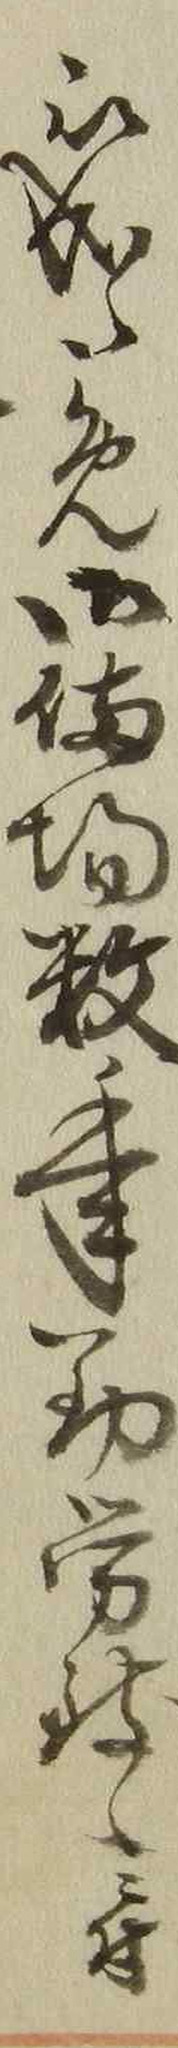被成御免御備場数年勤労致候ニ付
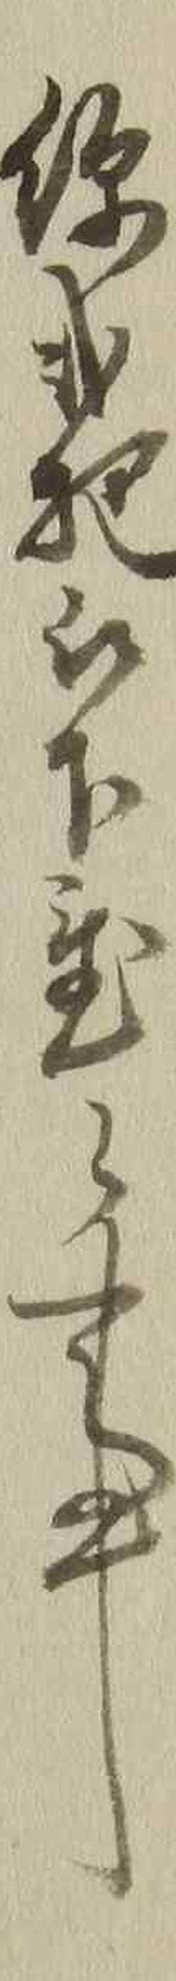綿弐把被下置候事
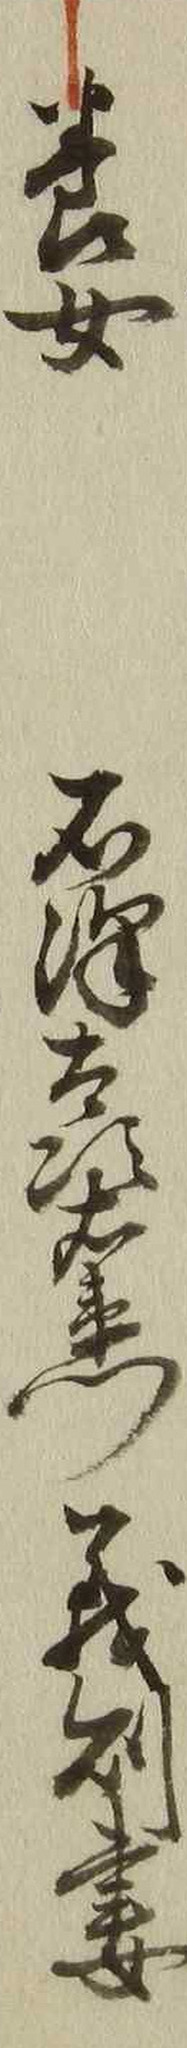養女石沢太次右衛門義則妻
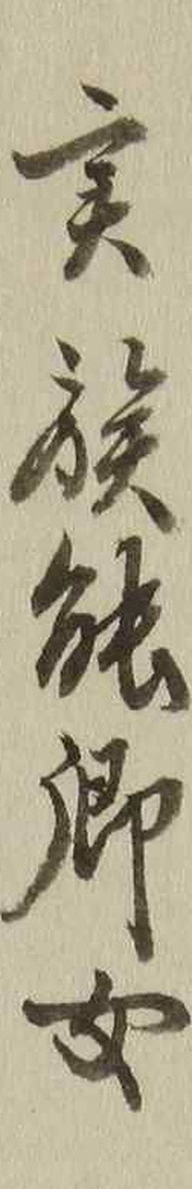実族能郷女
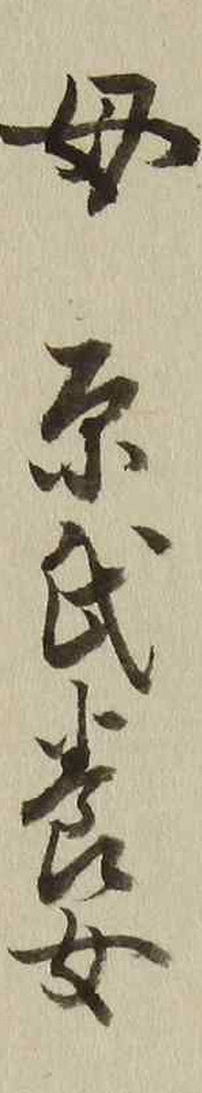母原氏養女
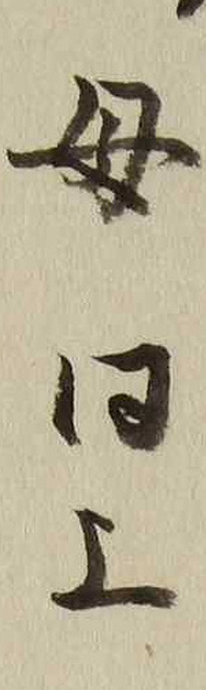母同上
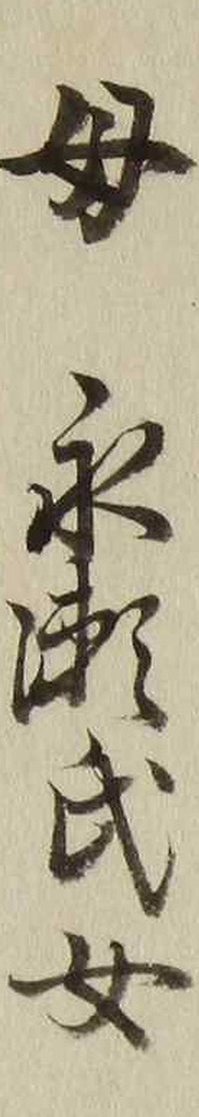母永瀬氏女
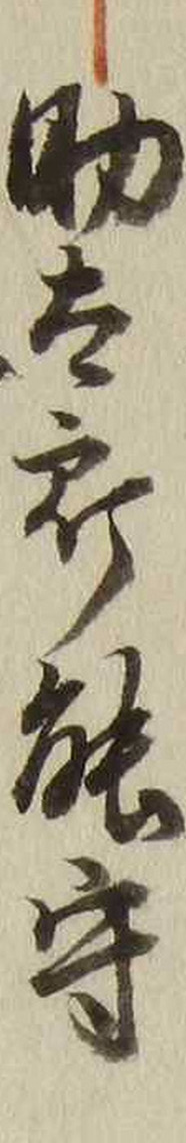助太郎能守
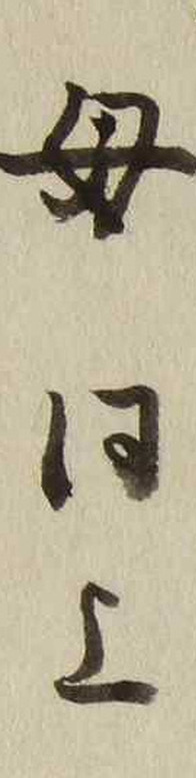母同上
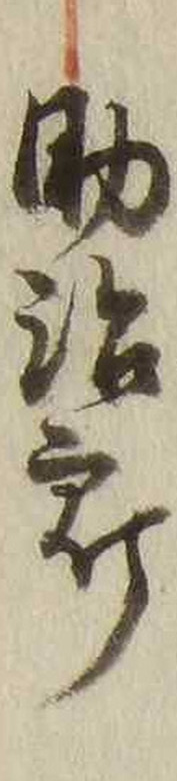助治郎
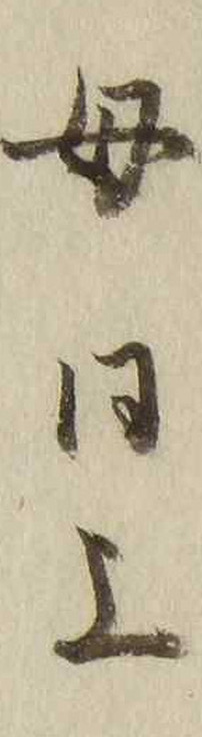母同上

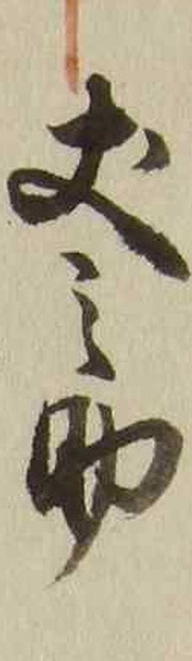丈之助
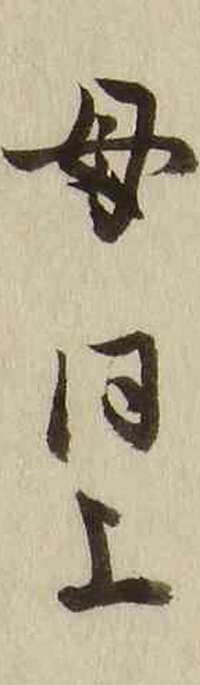母同上
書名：諸士系譜　巻之53　に之部4
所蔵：会津若松市立会津図書館
